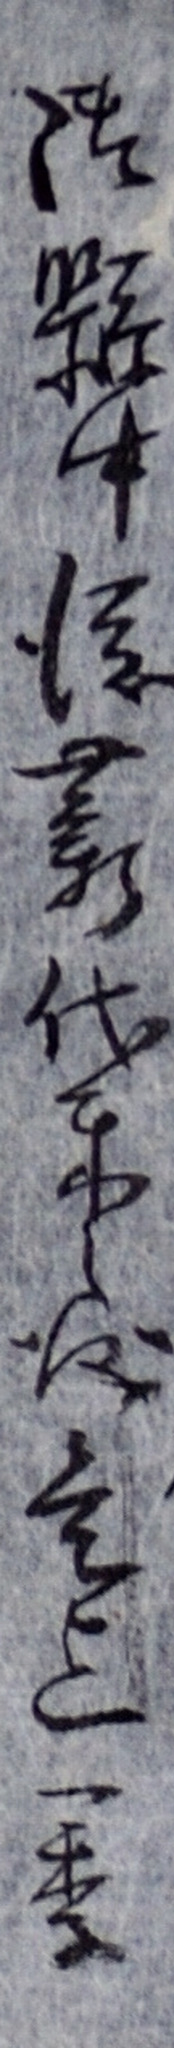御懸申渡薪代米之儀是迄一季
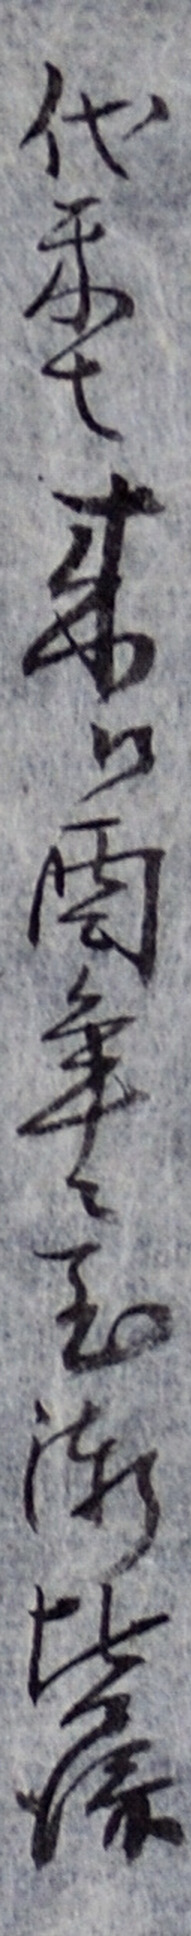代米は来ル酉年に至漸皆済
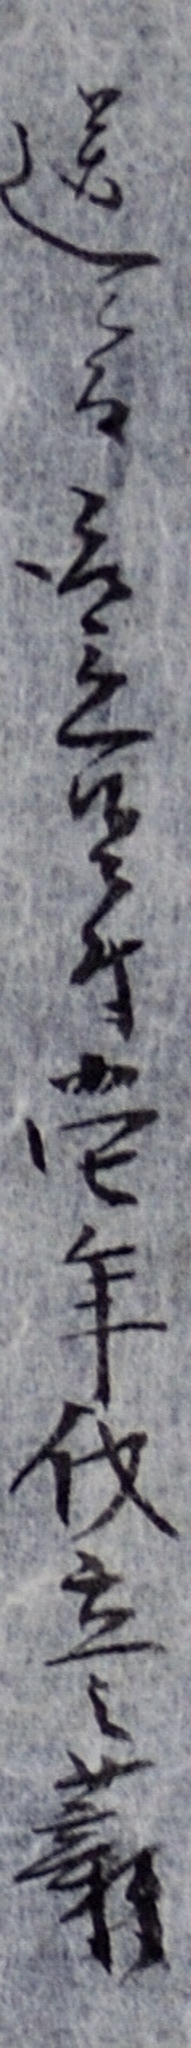送にて取立候に付当年伐立之薪
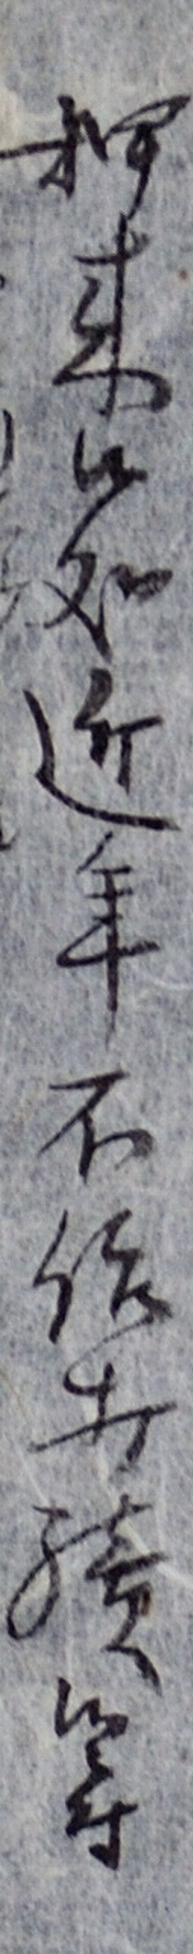押来候処近年不作打続候に付
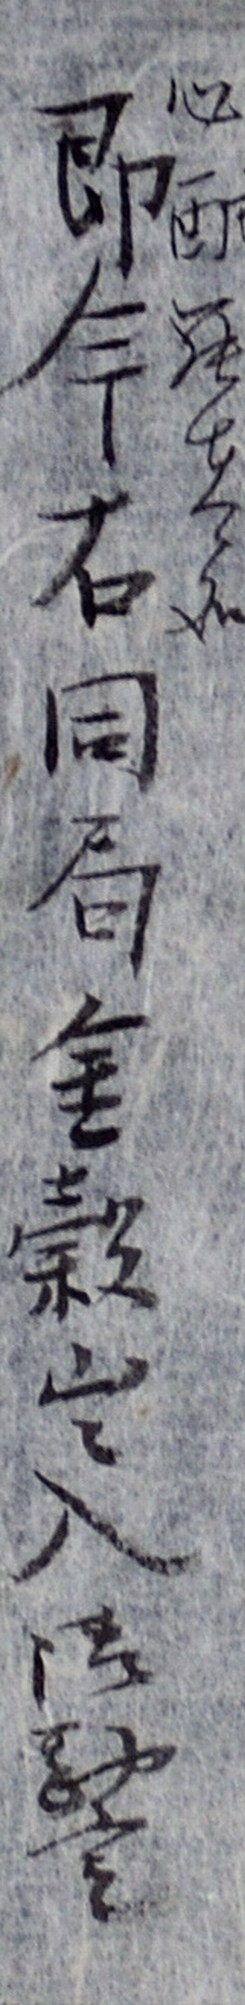即今右同局金穀出入御勘定
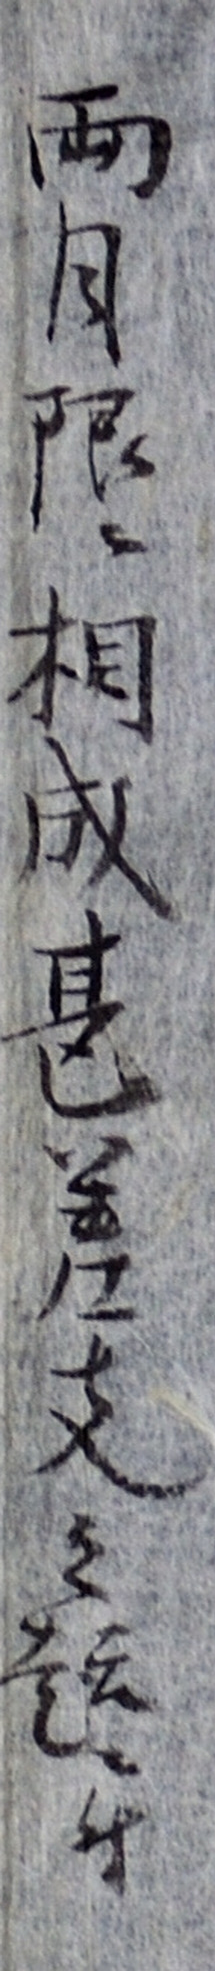両月限に相成甚差支之趣に付
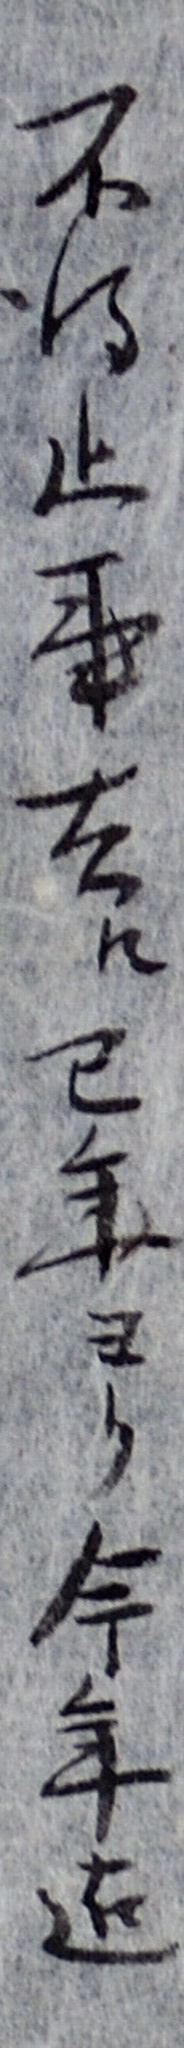不得止事去ル巳年ヨリ今年迄
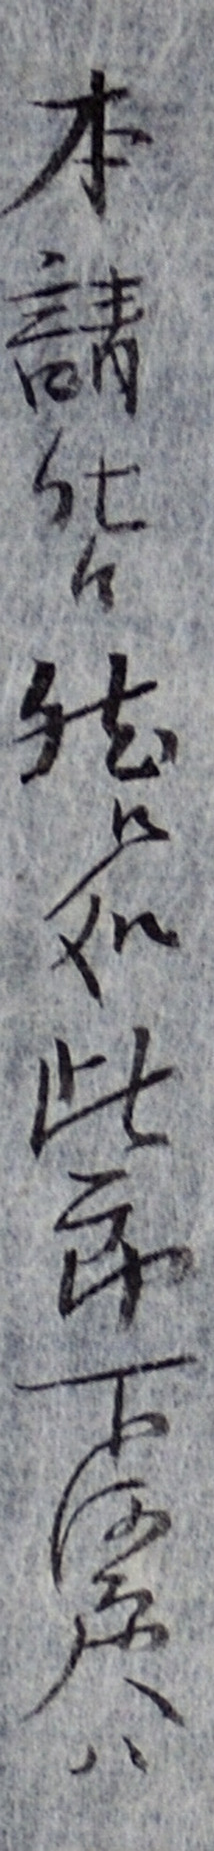本請仕候然ル処此節下河原へは
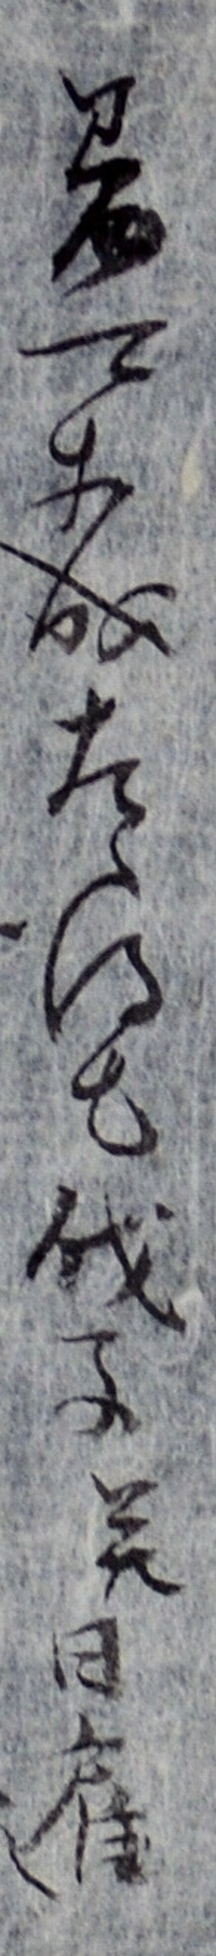着可相成左候得は伐子并日雇之
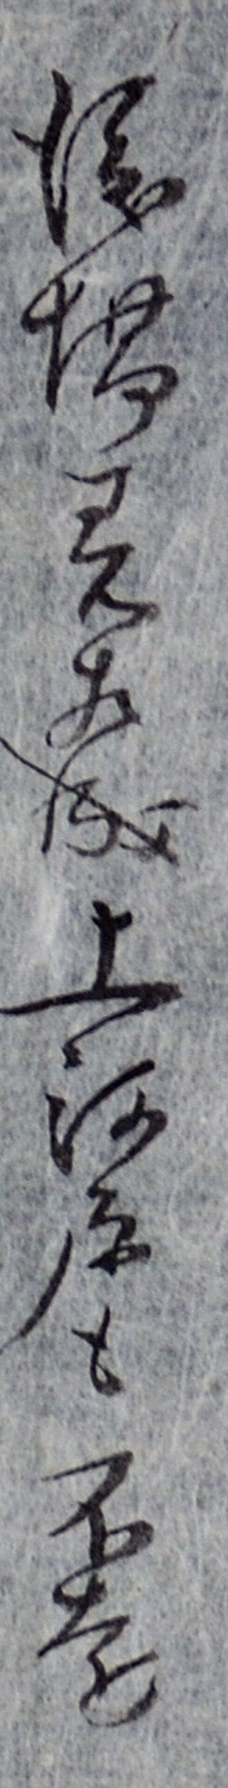渡場着相成上河原も不遠
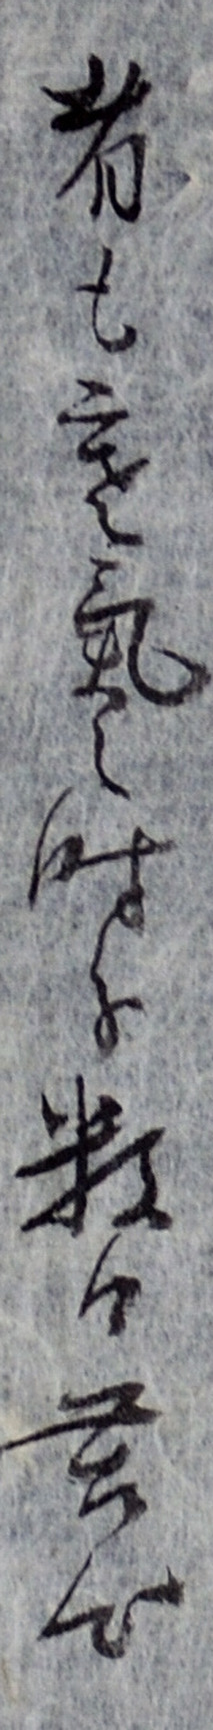者も寒気之時分数々苦心
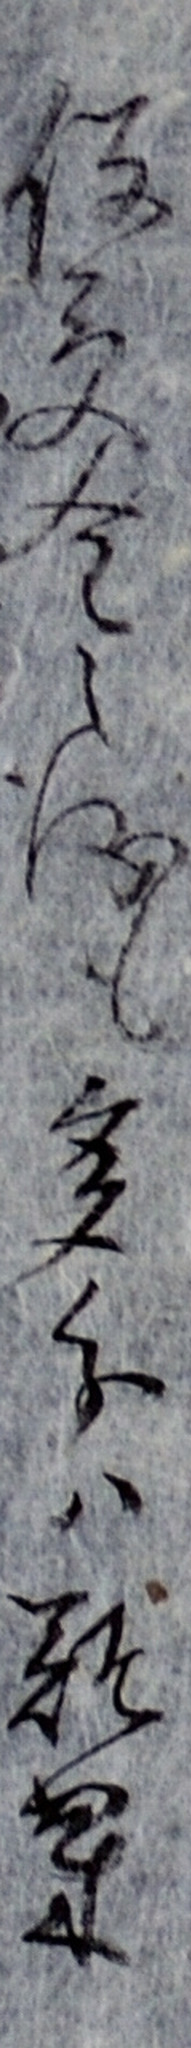仮受金之儀も多分は難果
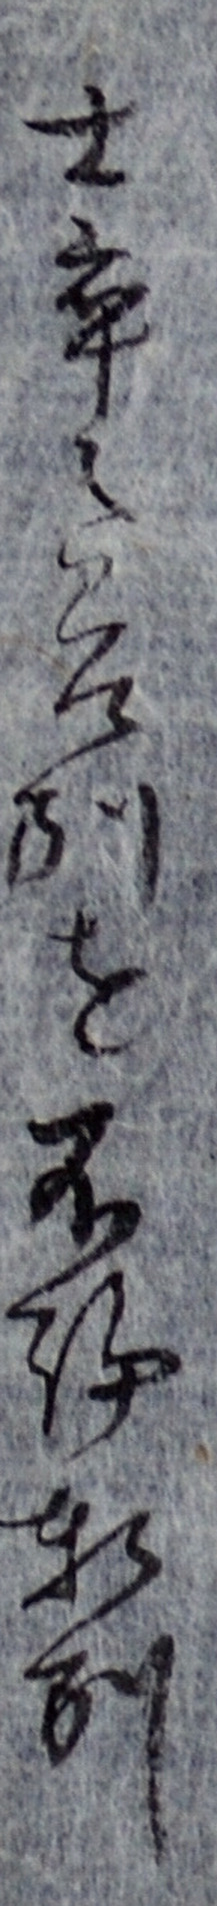士卒之差別を不論軒別
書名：書状
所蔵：伊那市立高遠町図書館・合同会社AMANE
